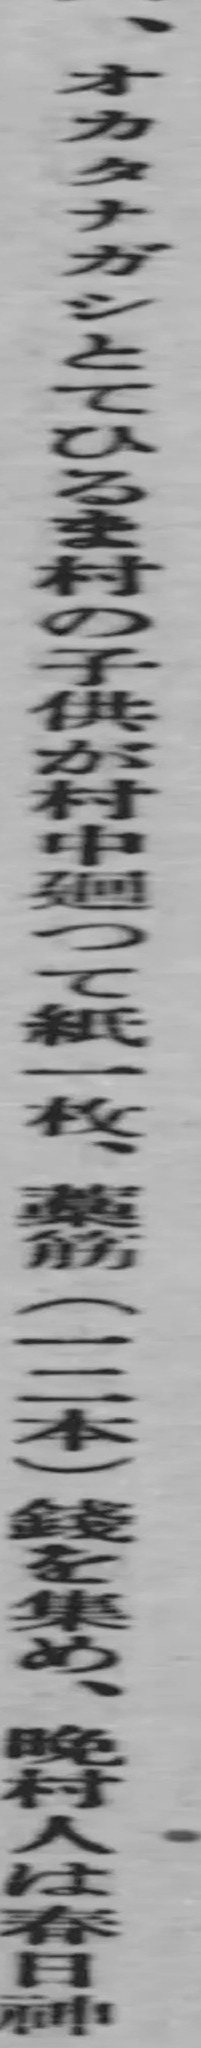ハ、オカタナガシとてひるま村の子供が村中廻つて紙一枚、藁筋(一二本)錢を集め、晩村人は春日神
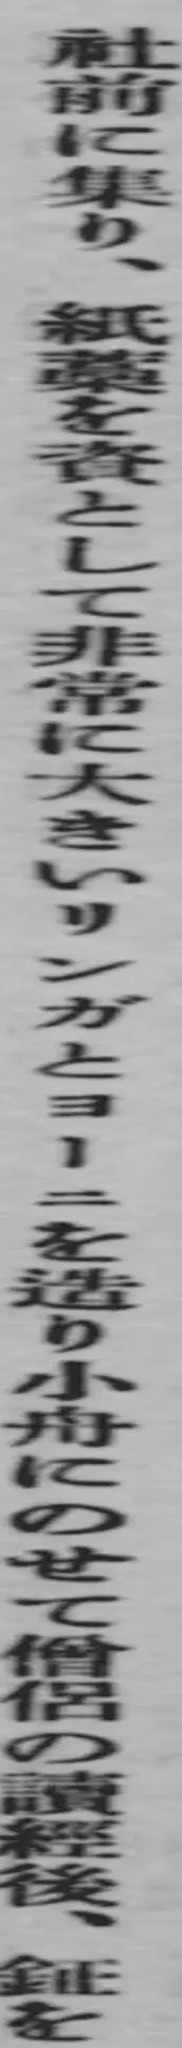社前に集り、紙藁を資として非常に大きいリンガとヨーニを造り小舟にのせて僧侶の讀經後、鉦を
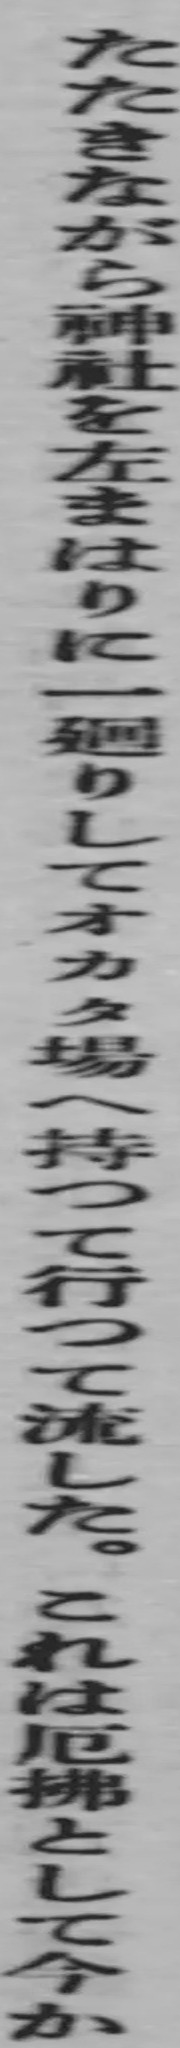たたきながら神社を左まはりに一廻りしてオカタ場へ持つて行つて流した。これは厄拂として今か
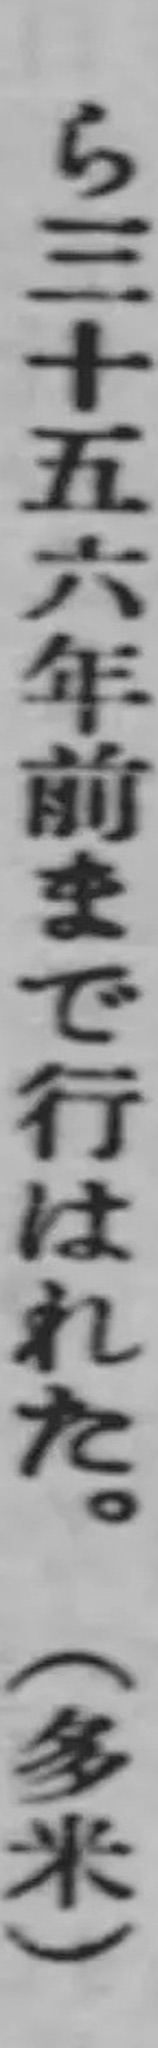ら三十五六年前まで行はれた。(多米)
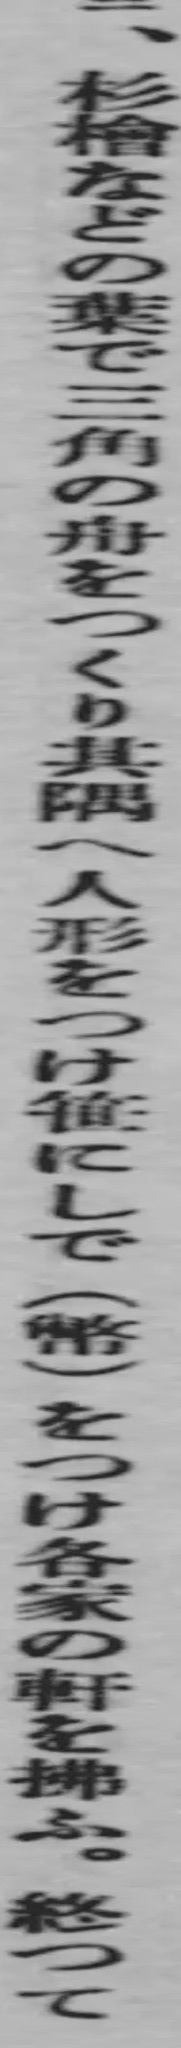ニ、杉檜などの葉で三角の舟をつくり其隅へ人形をつけ笹にしで(幣)をつけ各家の軒を拂ふ。終つて
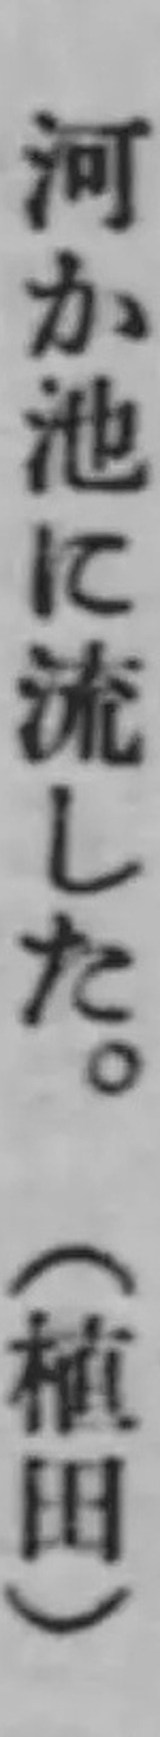河か池に流した。(植田)
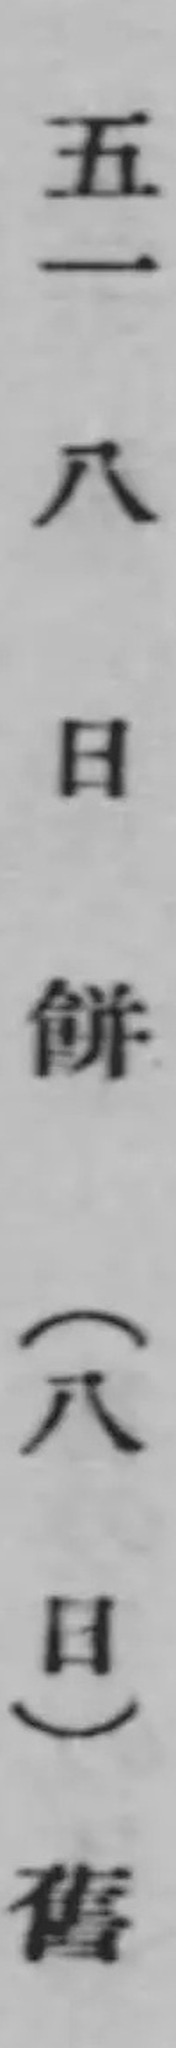五一八日餅(八日)舊
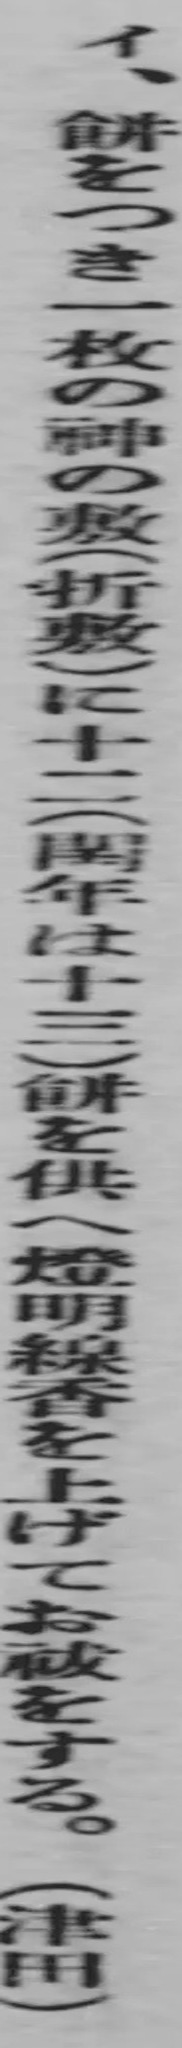イ、餅をつき一枚の神の敷(折敷)に十二(閏年は十三)餅を供へ燈明線香を上げてお祓いをする。(津田)
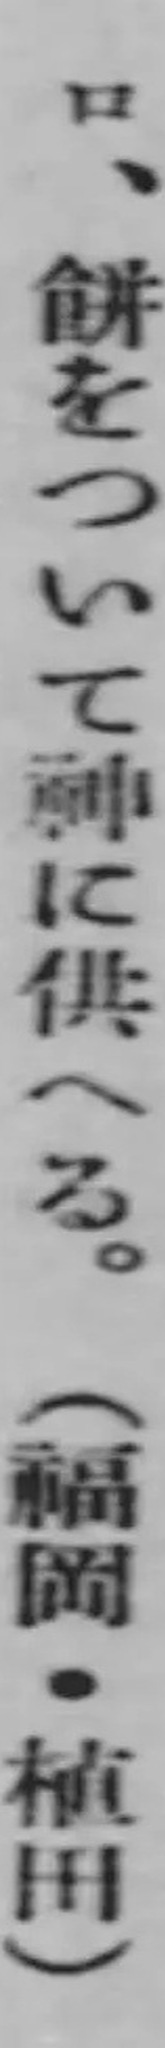ロ、餅をついて神に供へる。(福岡・植田)

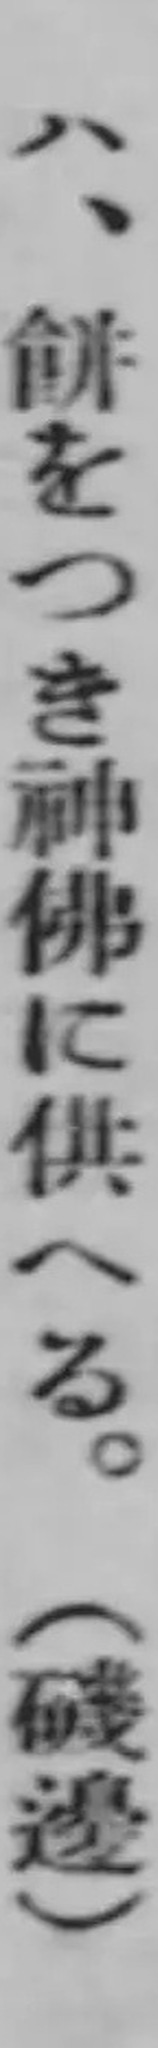ハ、餅をつき神佛に供へる。(磯邊)
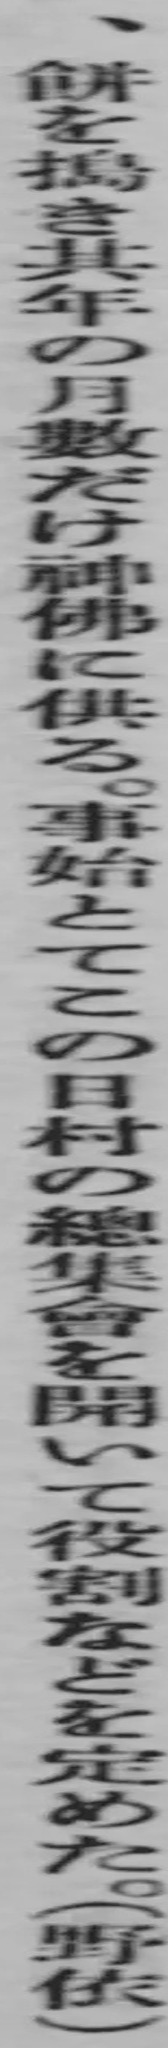ニ、餅を搗き其年の月數だけ神佛に供る。事始とてこの日村の總集會を開いて役割などを定めた。(野依)
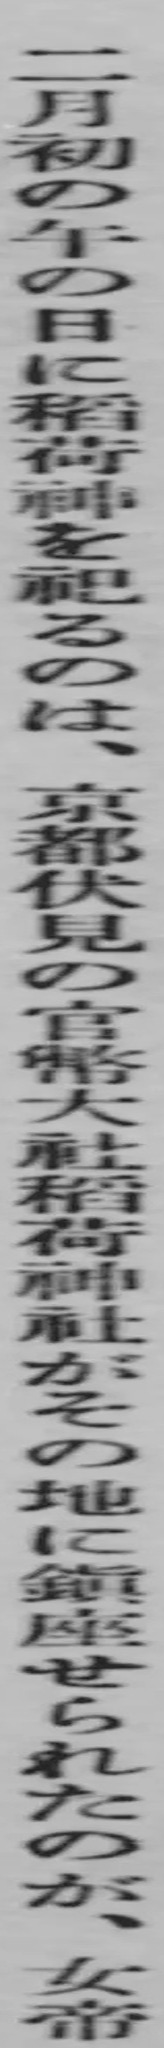二月初の午の日に稻荷神に祀るのは、京都伏見の官幣大社稻荷神社がその地に鎭座せられたのが、女帝
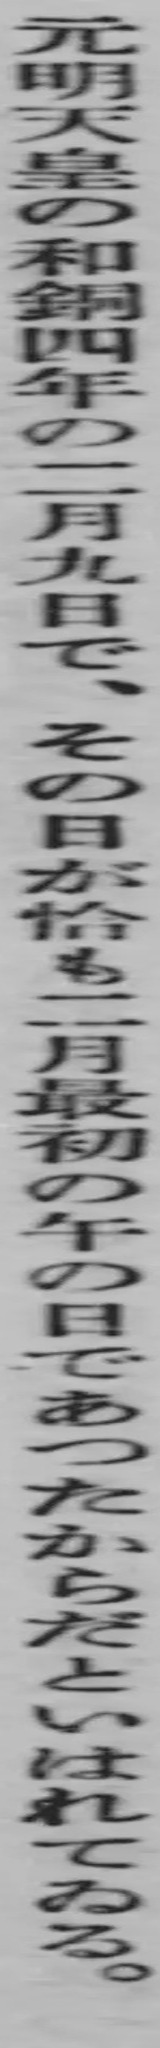元明天皇の和銅四年の二月九日で、その日が恰も二月最初の午の日であつたからだといはれてゐる。
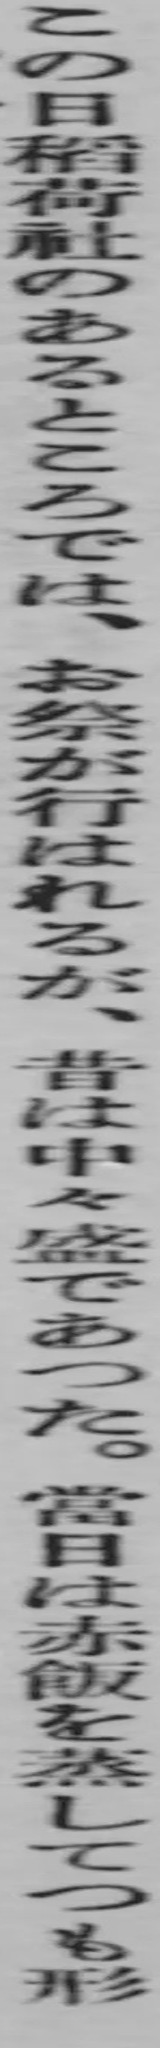この日稻荷社のあるところでは、お祭が行はれるが、昔は中々盛であつた、當日は赤飯を蒸してつも形
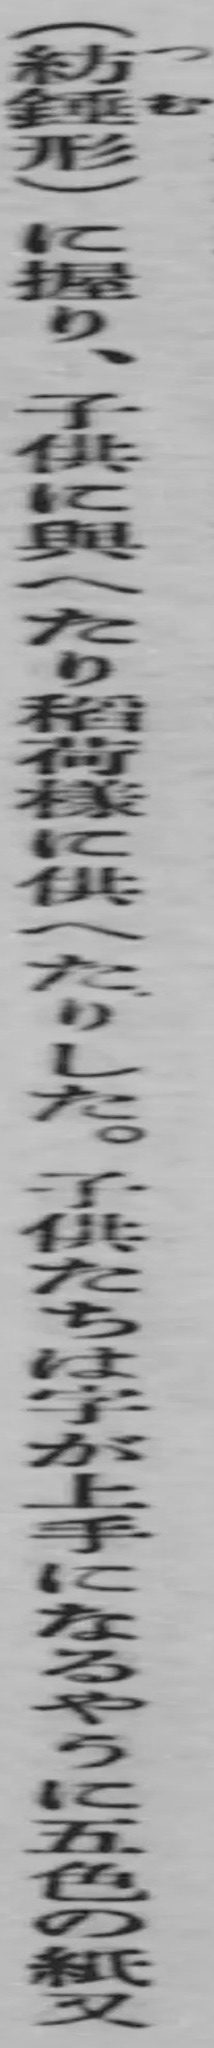(紡錘形)に握り、子供に與へたり稻荷様に供へたりした。子供たちは字が上手になるやうに五色の紙又
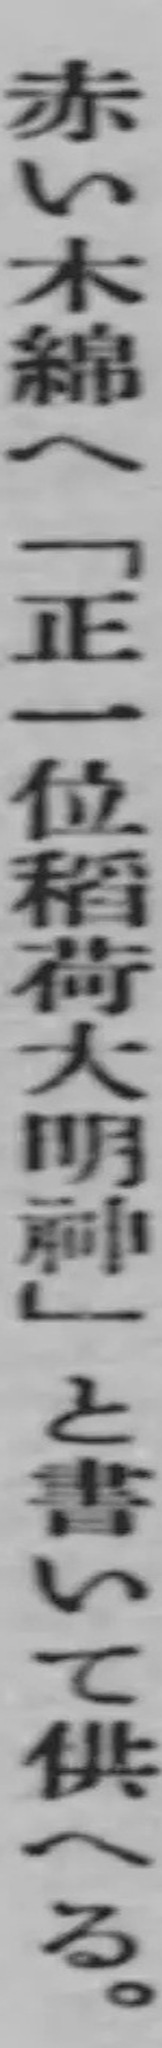赤い木綿へ「正一位稻荷大明神」と書いて供へる。
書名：豊橋の年中行事
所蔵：国立国会図書館 National Diet Library, JAPAN
